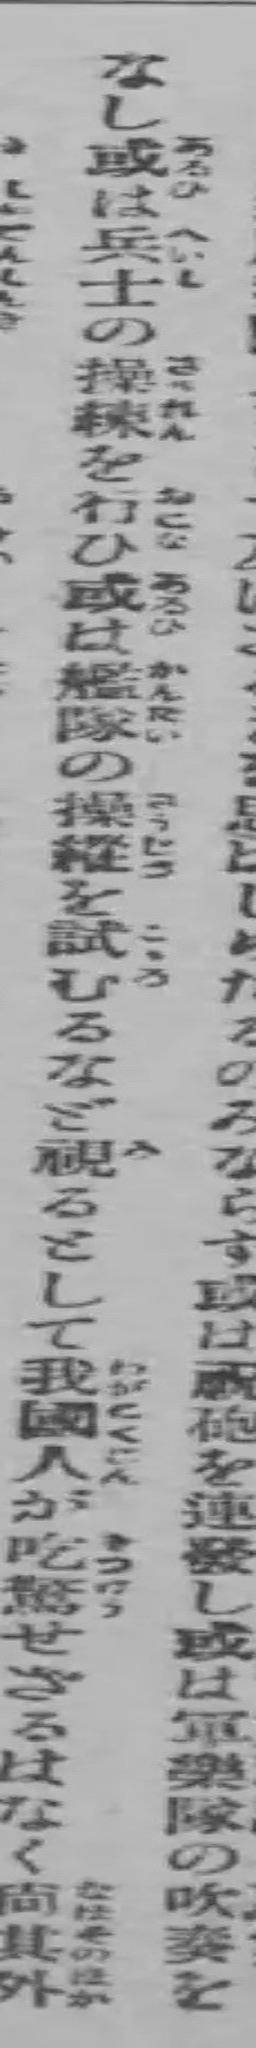なし或は兵士の操練を行ひ或は艦隊の操縦を試むるなど視るとして我国人が吃驚せざるはなく尚其外
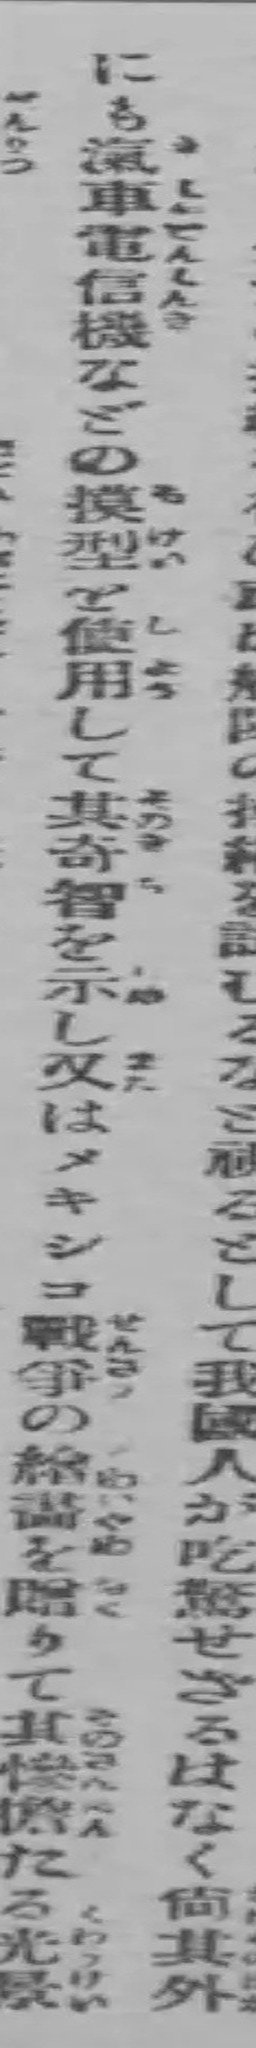にも汽車電信機などの模型を使用して其奇智を示し又はメキシコ戦争の絵画を贈りて其惨憺たる光景
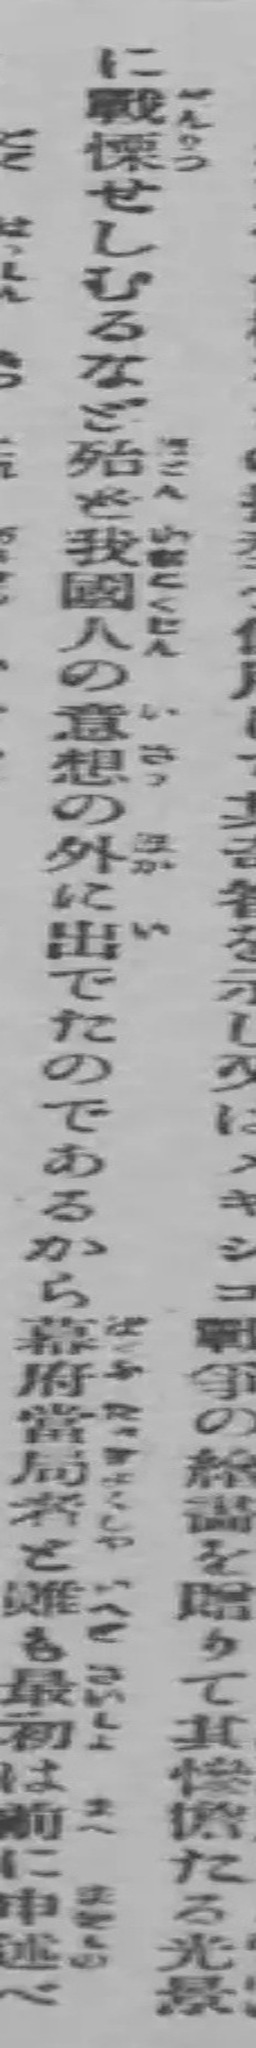に戦慄せしむるなど殆ど我国人の意想の外に出でたのであるから幕府当局者と雖も最初は前に申述べ
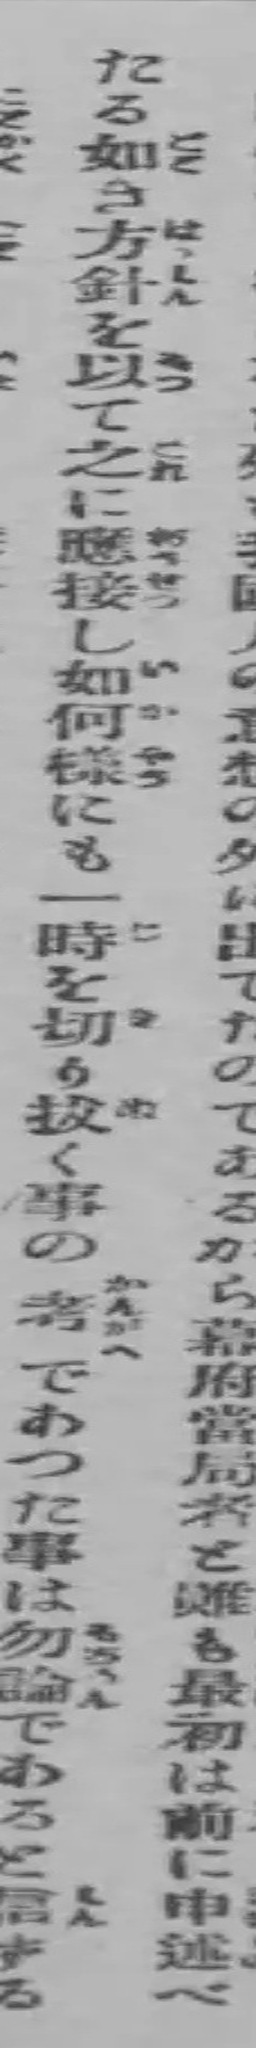たる如き方針を以て之に応接し如何様にも一時を切り抜く事の考であつた事は勿論であると信ずる
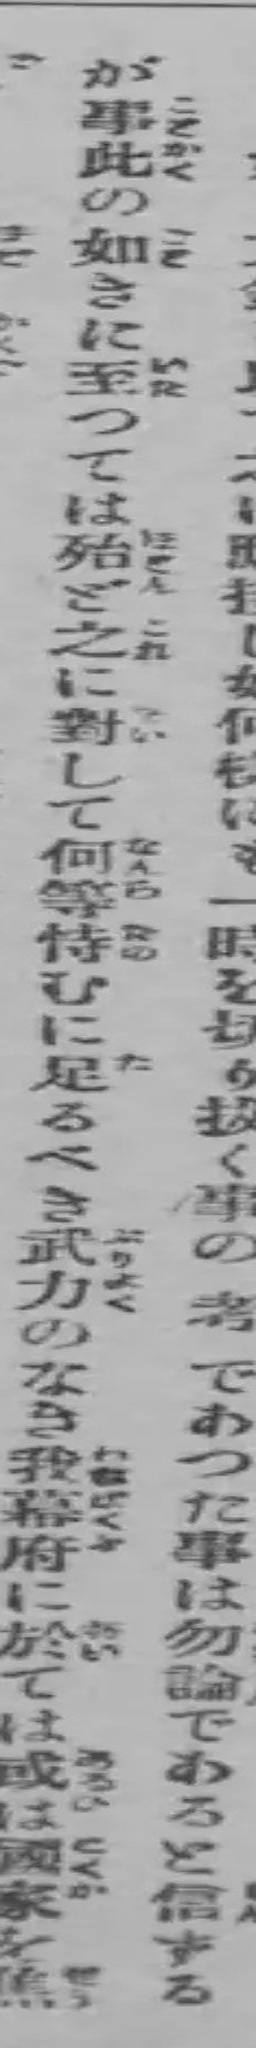が事此の如きに至つては殆ど之に対して何等恃むに足るべき武力のなき我幕府に於ては或は国家を焦
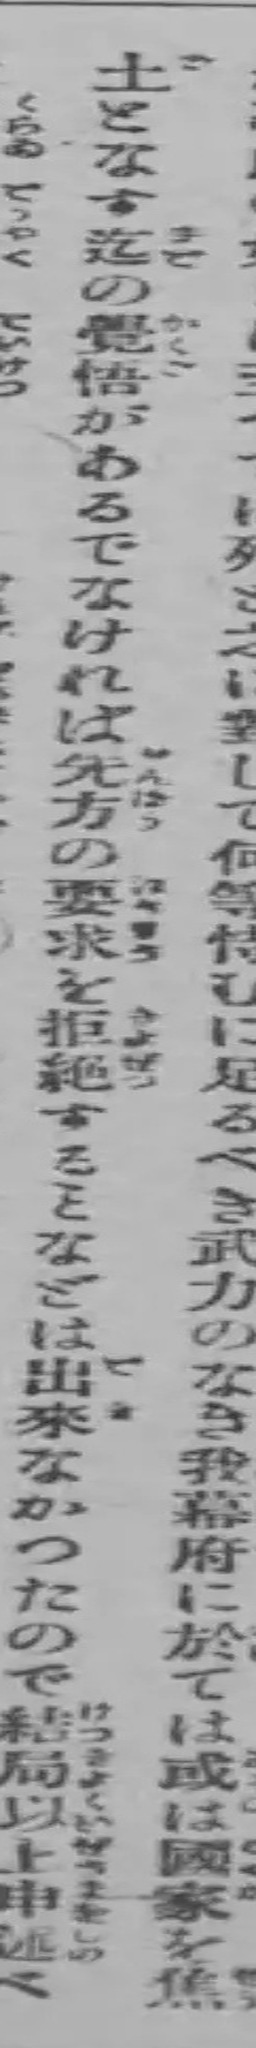土となす迄の覚悟があるでなければ先方の要求を拒絶することなどは出来なかつたので結局以上申述べ
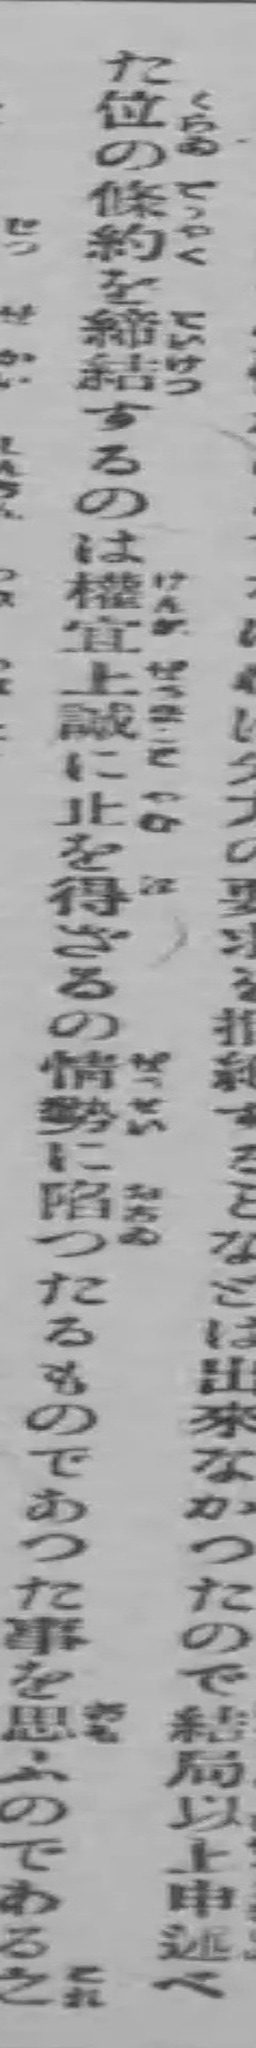た位の条約を締結するのは権宜上誠に止を得ざるの情勢に陥つたるものであつた事を思ふのである之
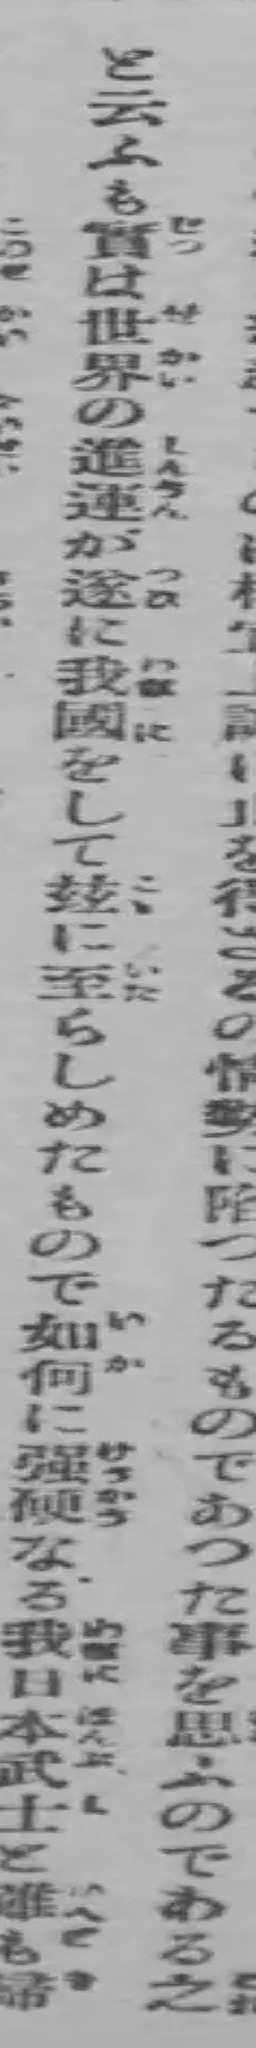と云ふも実は世界の進運が遂に我国をして茲に至らしめたもので如何に強硬なる我日本武士と雖も帰
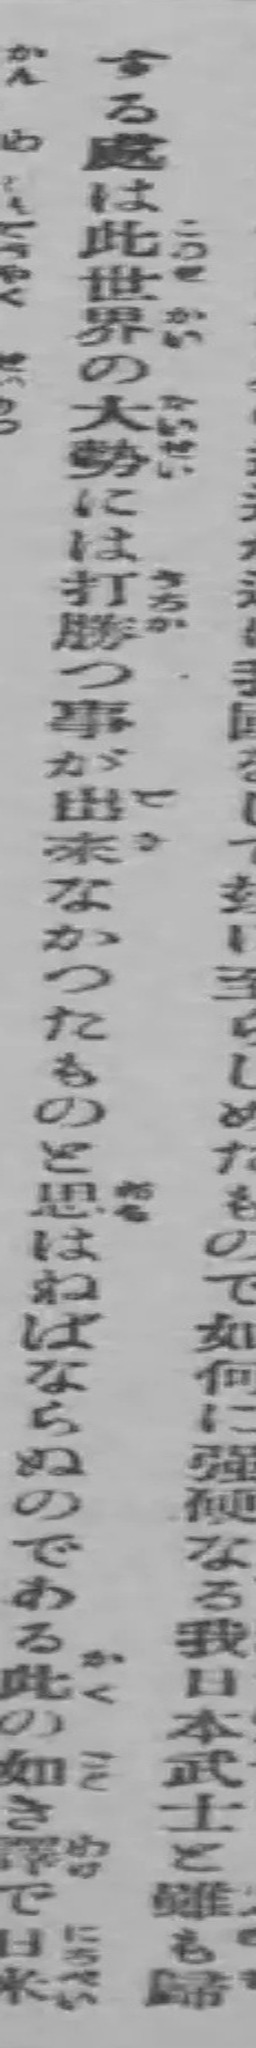する処は此世界の大勢には打勝つ事が出来なかつたものと思はねばならぬのである此の如き訳で日米
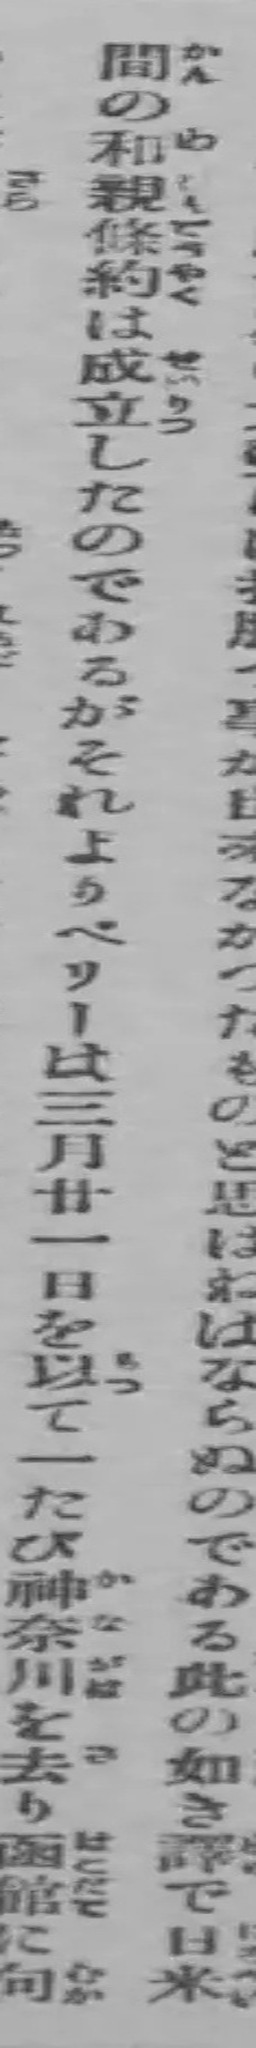間の和親条約は成立したのであるがそれよりペリーは三月廿一日を以て一たび神奈川を去り函館に向
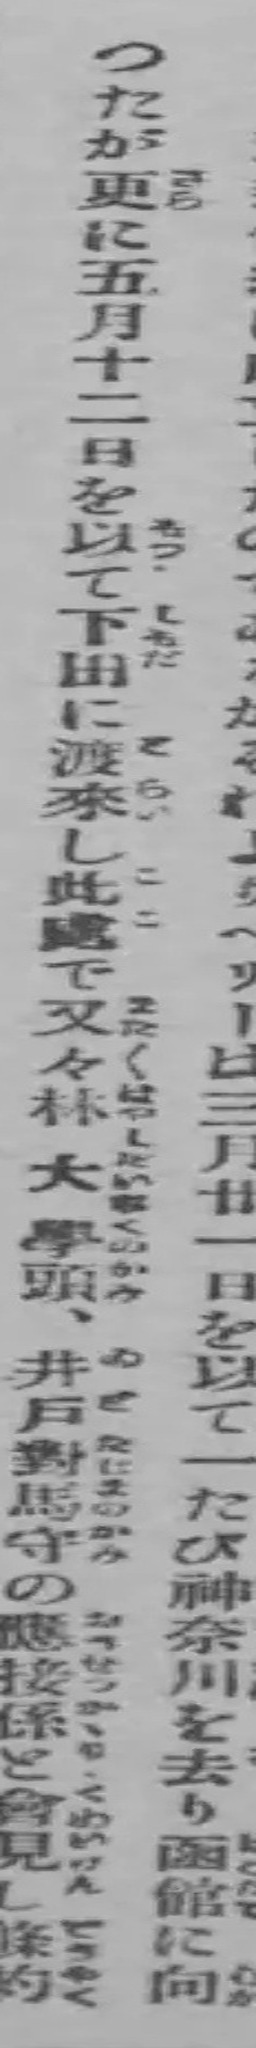つたが更に五月十二日を以て下田に渡来し此処で又々林大学頭、井戸対馬守の応接係と会見し条約
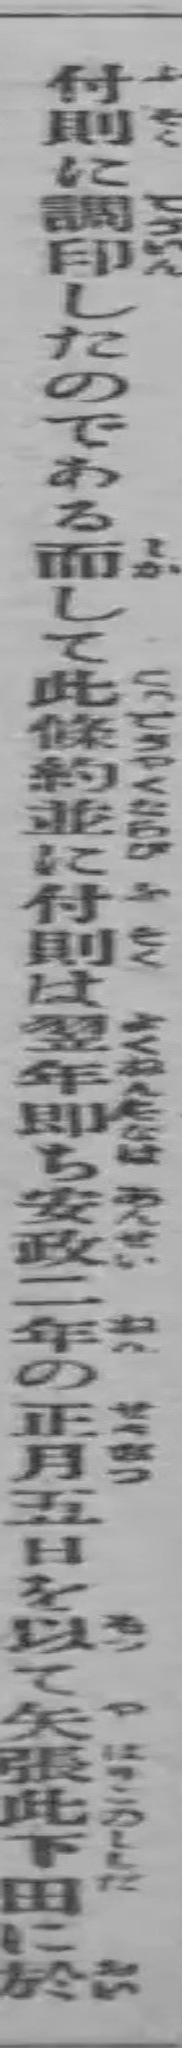付則に調印したのである而して此条約並に付則は翌年即ち安政二年の正月五日を以て矢張此下田に於
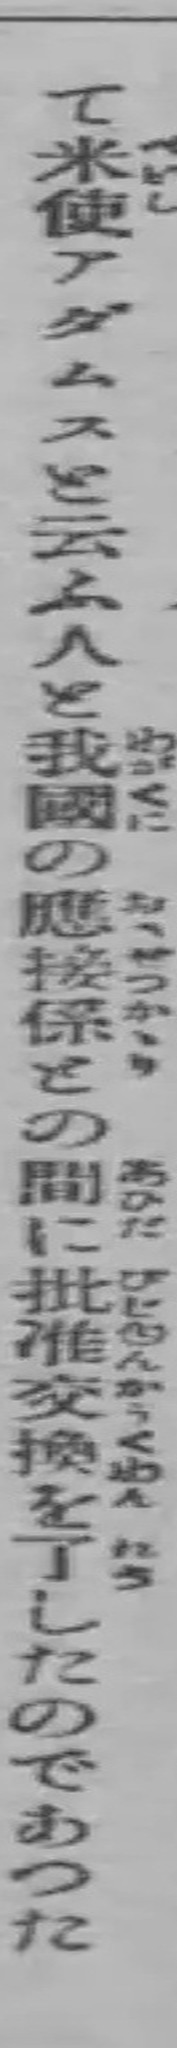て米使アダムスと云ふ人と我国の応接係との間に批准交換を了したのであつた
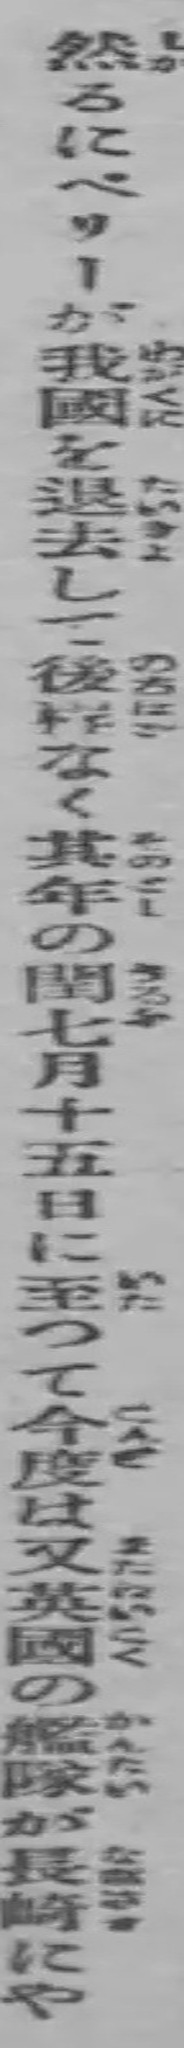英艦の来航然るにペリーが我国を退去して後程なく其年の閏七月十五日に至つて今度は又英国の艦隊が長崎にや
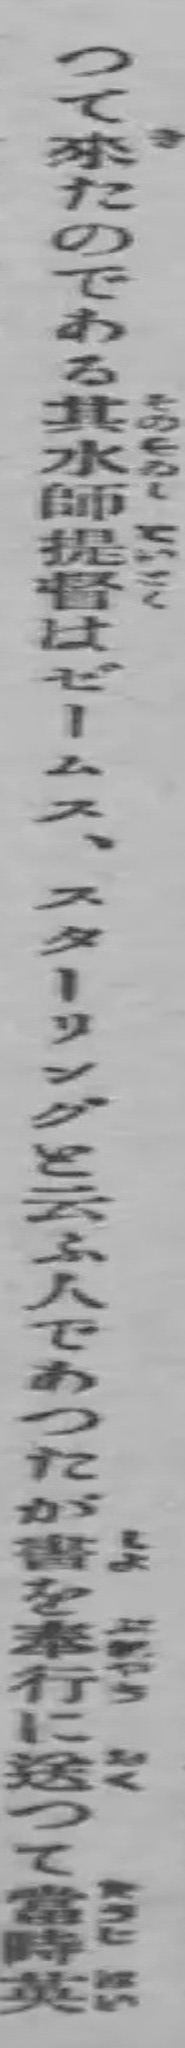つて来たのである其水師提督はゼームス、スターリングと云ふ人であつたが書を奉行に送つて当時英
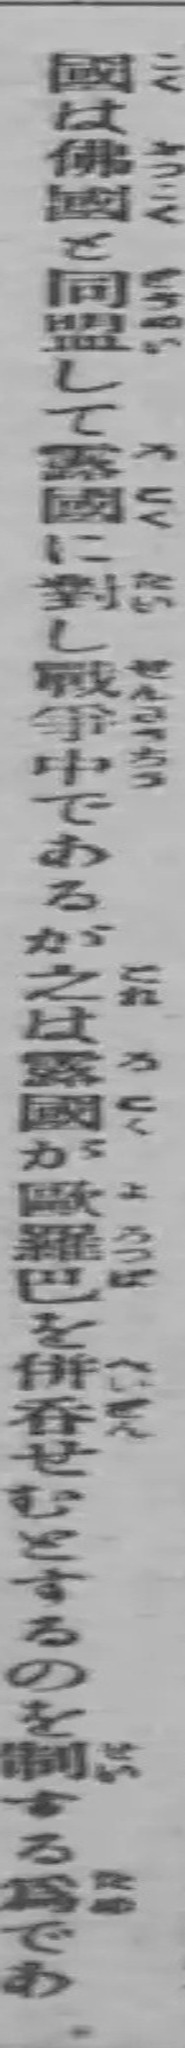国は仏国と同盟して露国に対し戦争中であるが之は露国が欧羅巴を併呑せむとするのを制する為であ
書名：豊橋市史談
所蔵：国立国会図書館 National Diet Library, JAPAN
